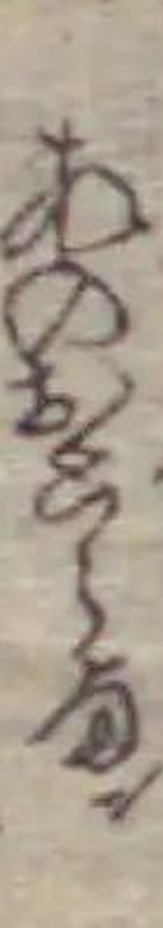あのおとら様ン
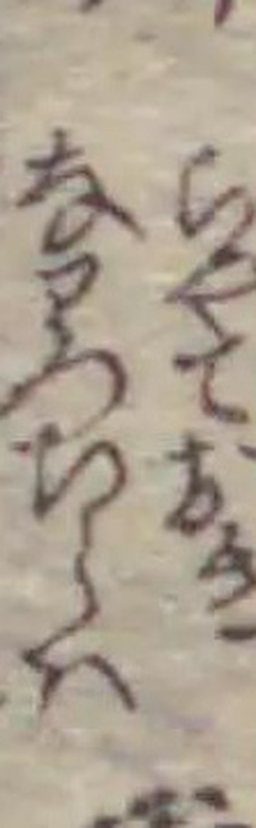なわつちらは
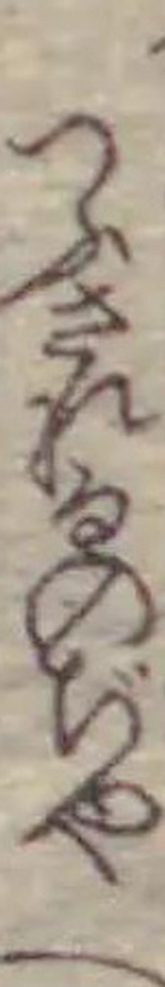つふされるのぢや
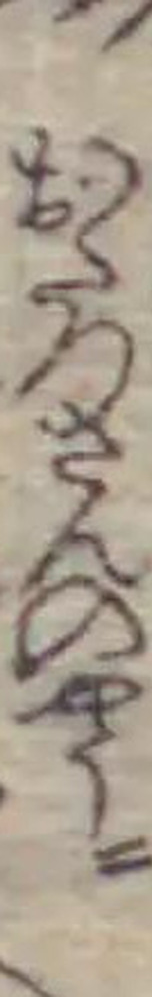おたつさんのやうに
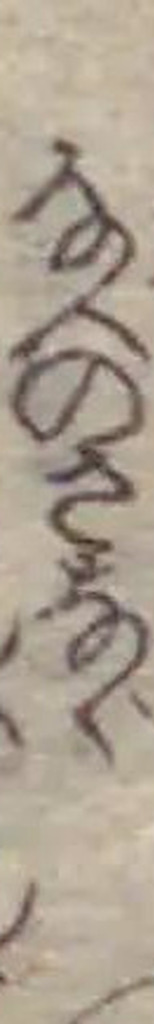ねへのさなぐ
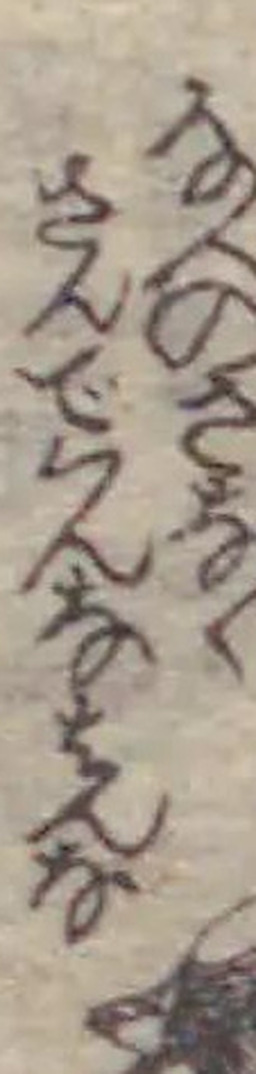さんでくんなはんな
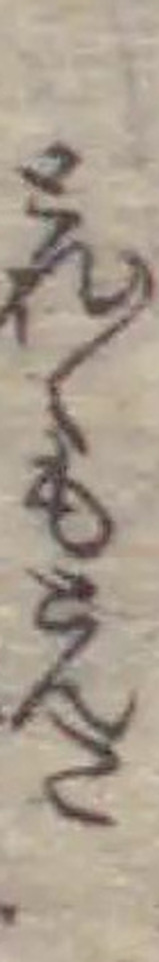とれ〳〵もとんた

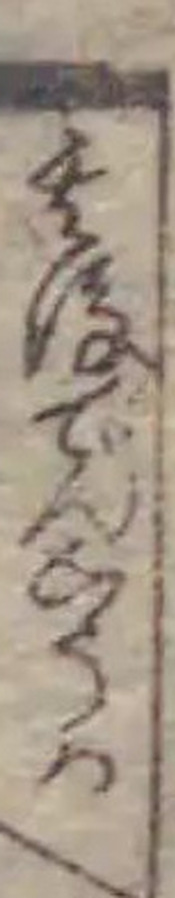其後でんとうか
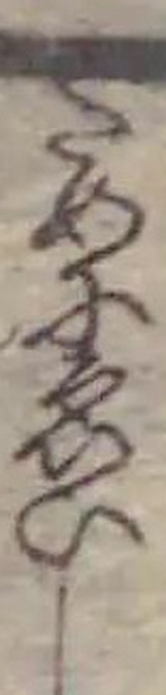ためにゑひ
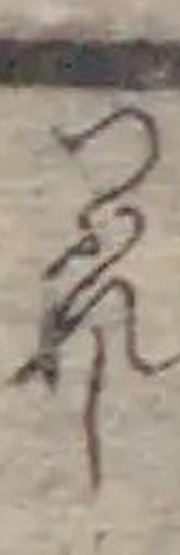つふれし
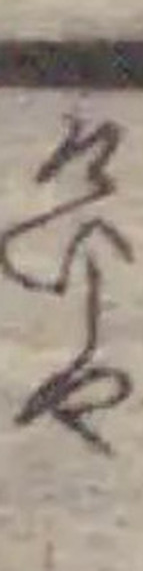けいしや
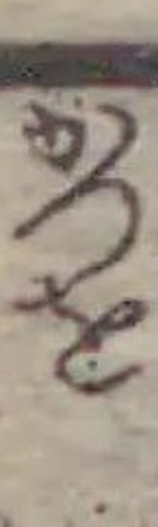かつを
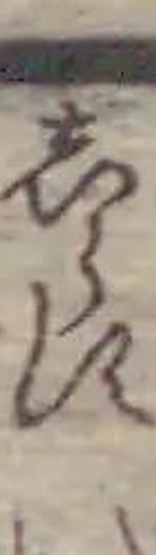しらす
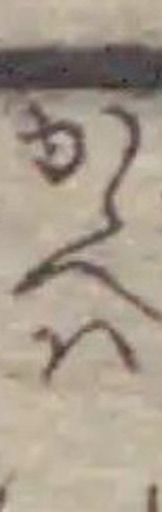かゝへは
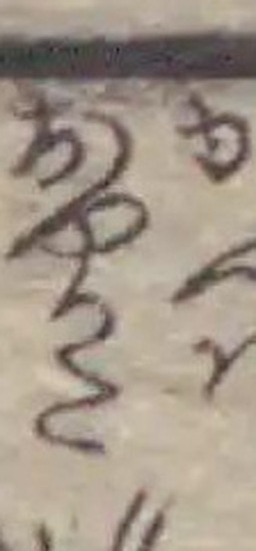おやかた
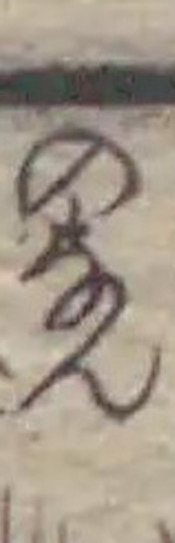のなん
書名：藝者五人娘 2巻
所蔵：国立国会図書館 National Diet Library, JAPAN
